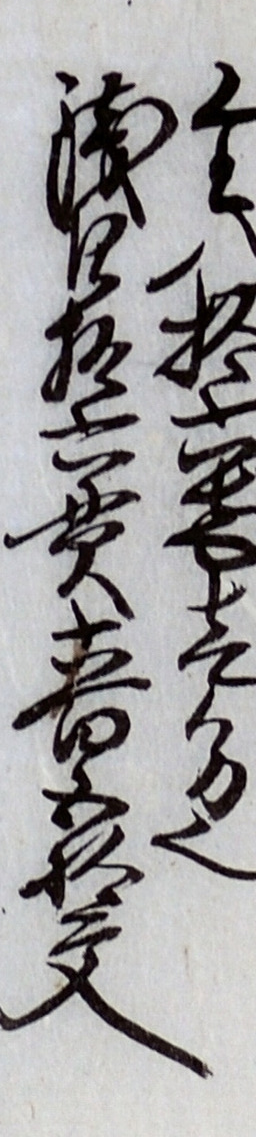銭四拾六貫六百五拾文
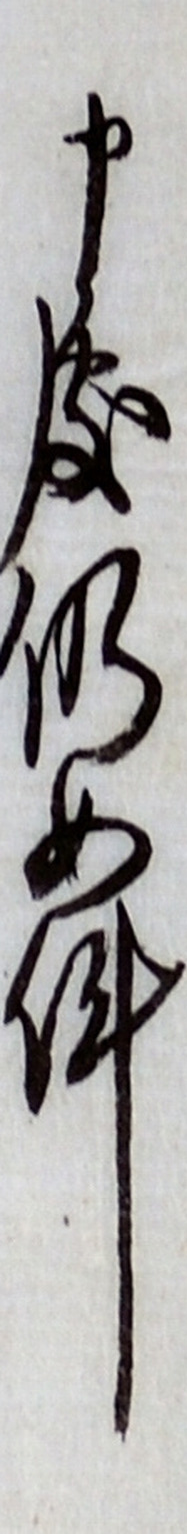申処仍如件
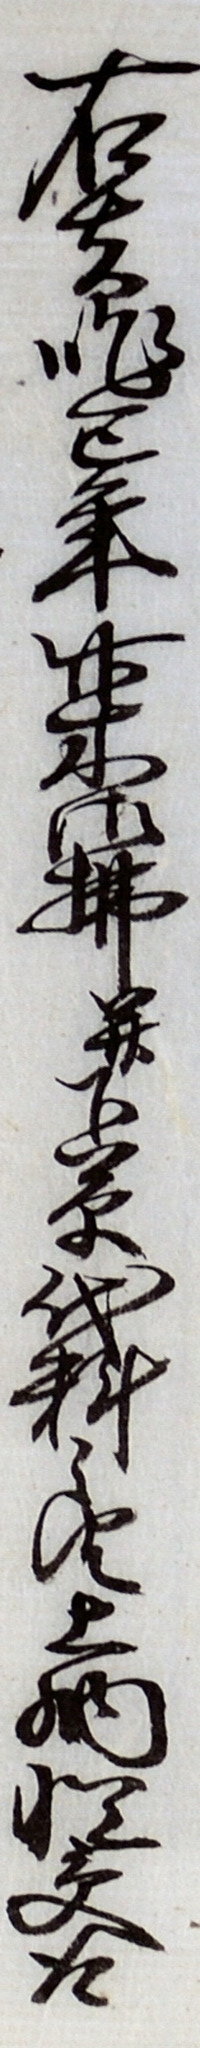右者昨巳年竹木御払幷下草代料之由上納慥受取
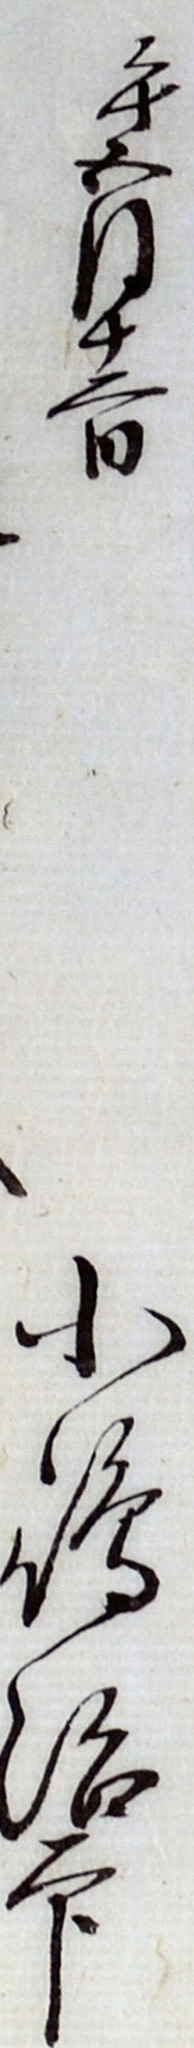午五月十二日小島治印
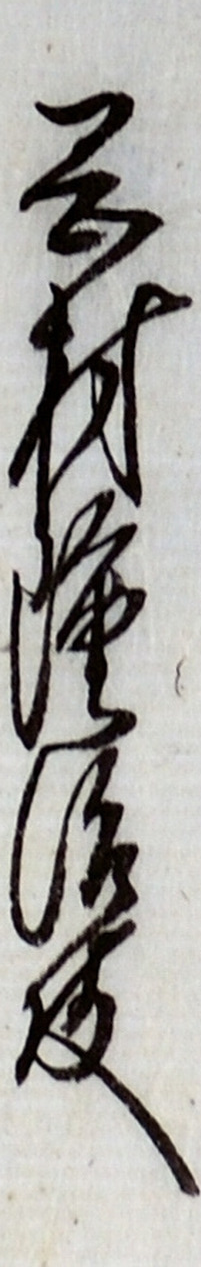岡村鍾治殿
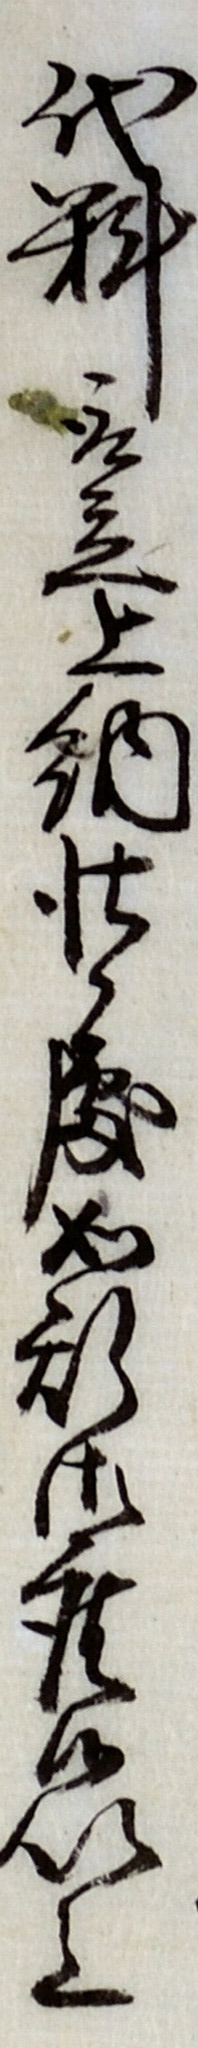代料取立上納仕候処如斯御座候以上
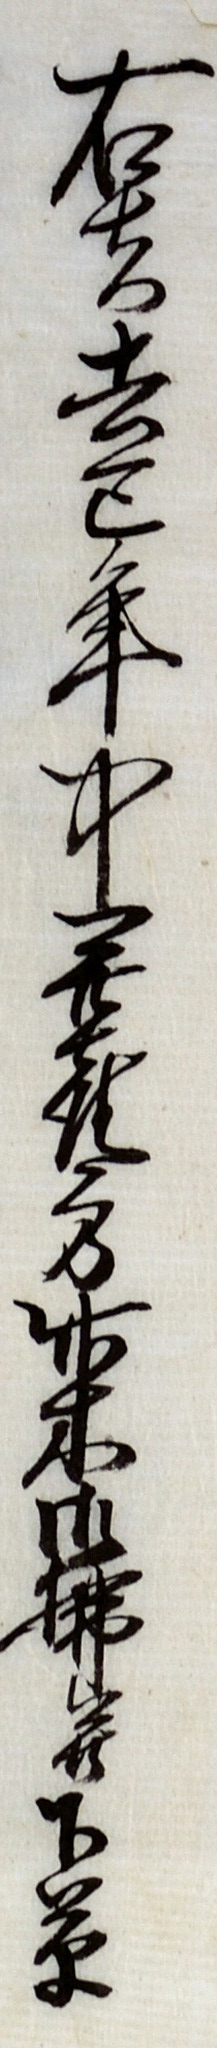右者去巳年中開産方竹木御払幷下草
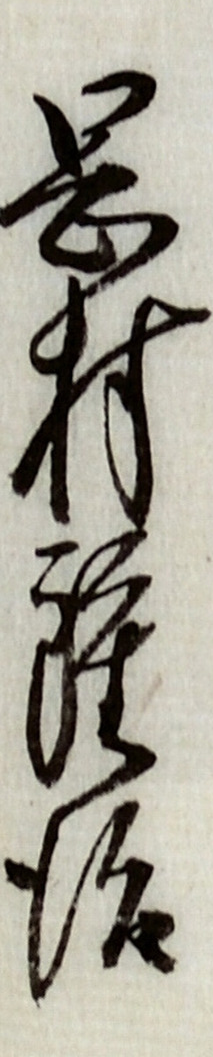岡村鍾治
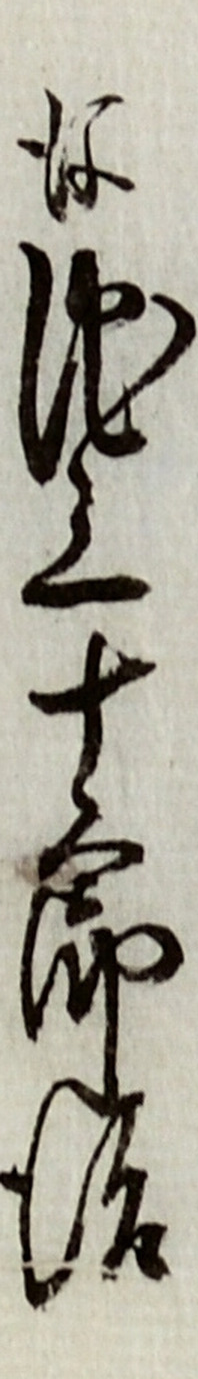後池上十郎治
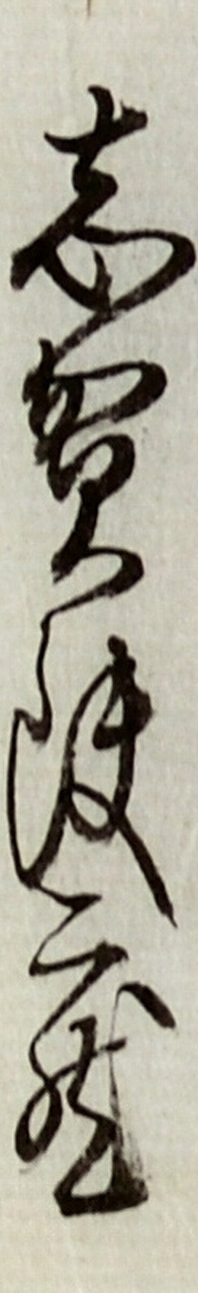志賀鉄蔵
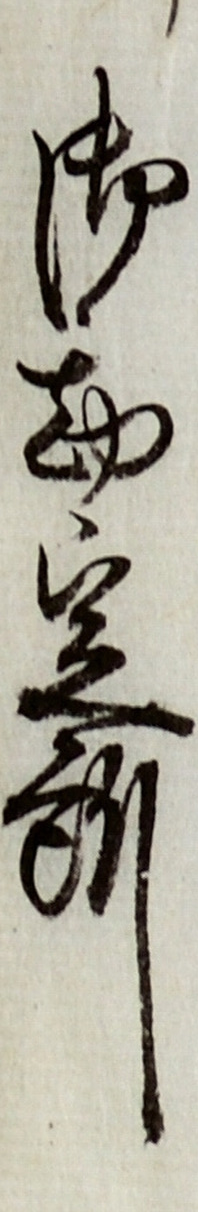御勘定所
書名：御山方御林方御藪方巳年中請払御勘定帳
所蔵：伊那市立高遠町図書館・合同会社AMANE
